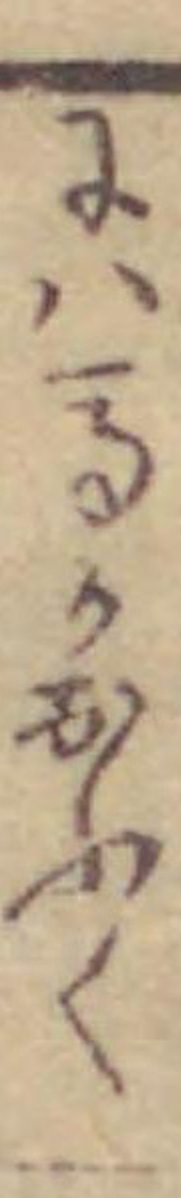には馬かおふく
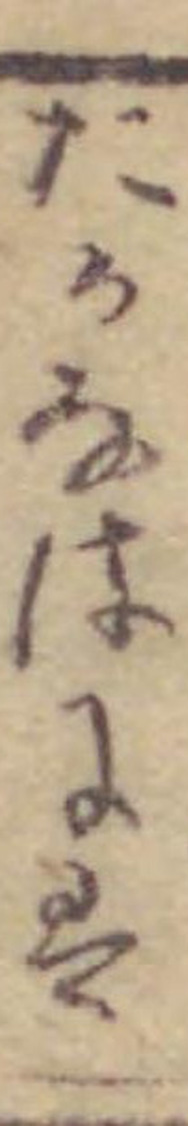たかなはには
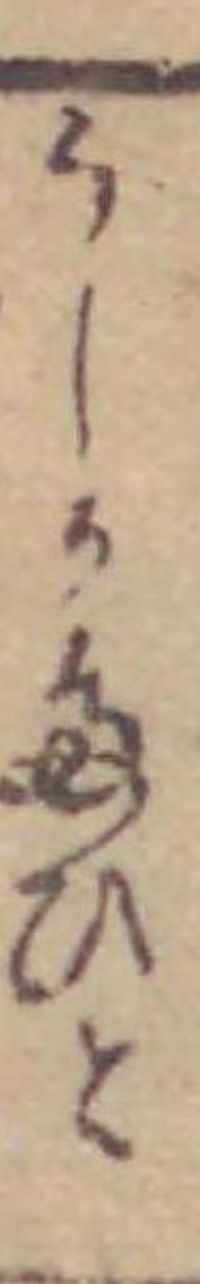うしか多ひと
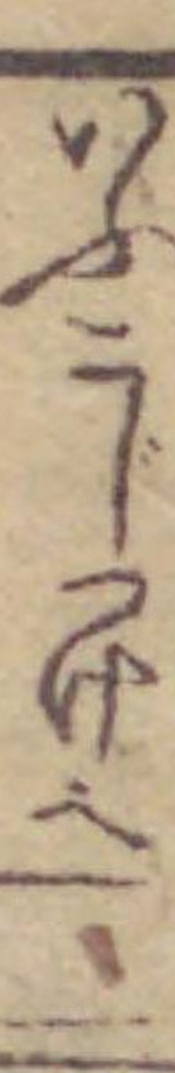いふこじつけ也
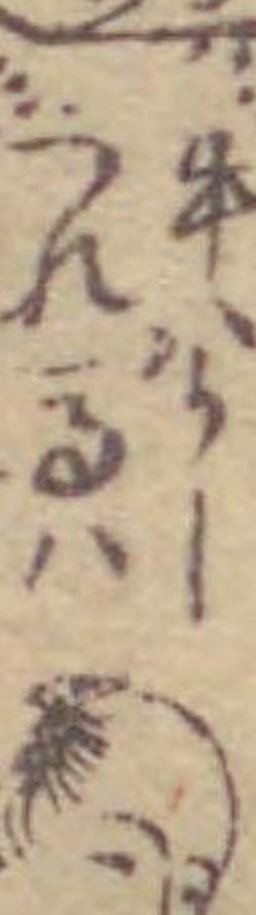つれ馬は
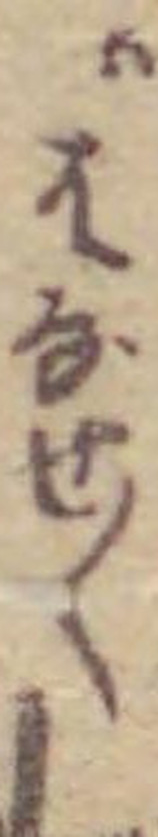はなせ〳〵
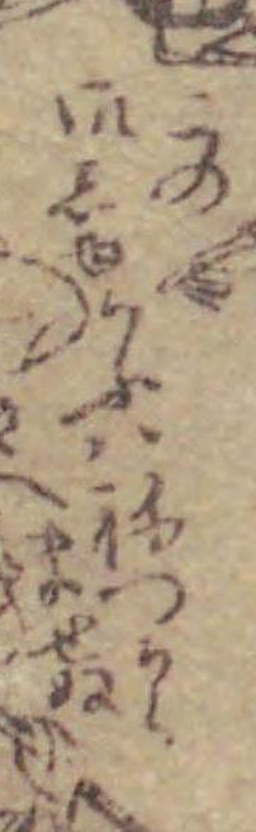御しゆかふはねつから

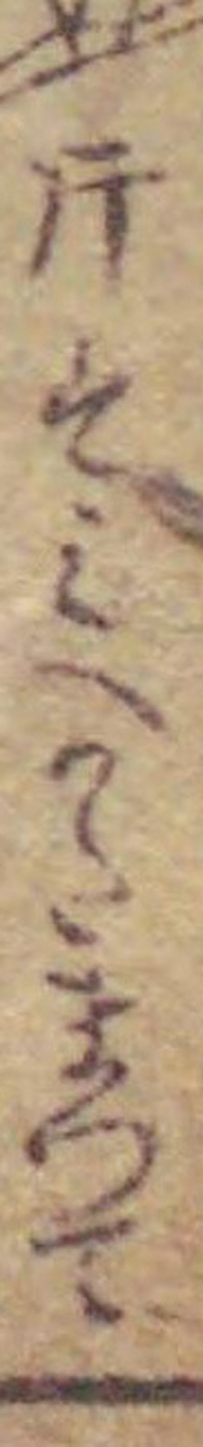片すみへかたまつて
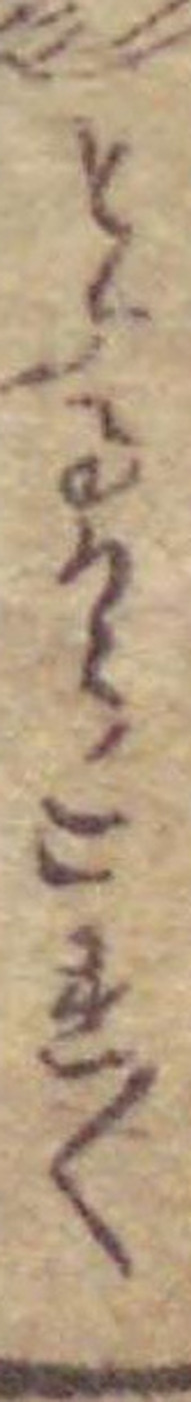とふるからこれ〳〵
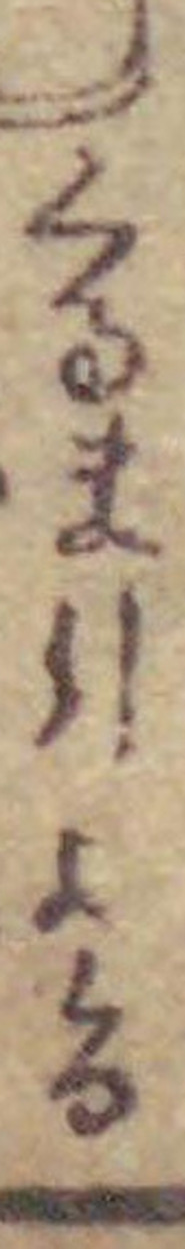くるま引よける
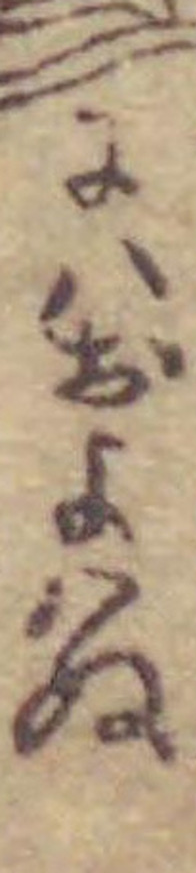にはおよはぬ
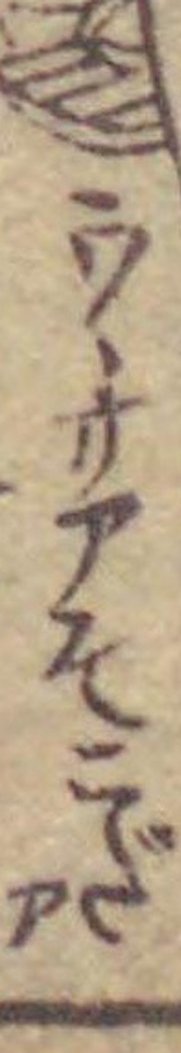ウヽサアそこだァ
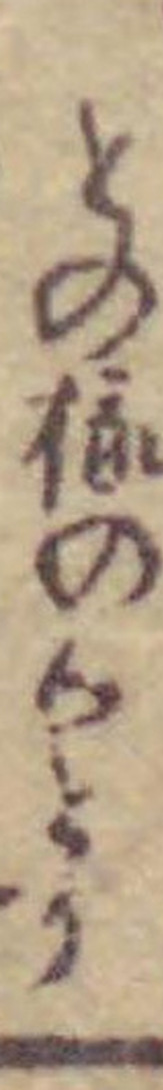との様のおとう
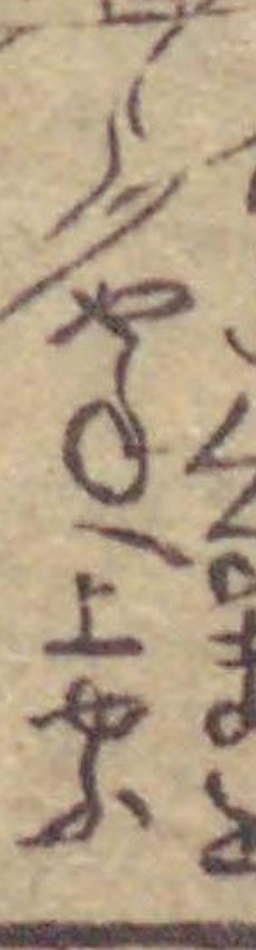やねへ上やふ
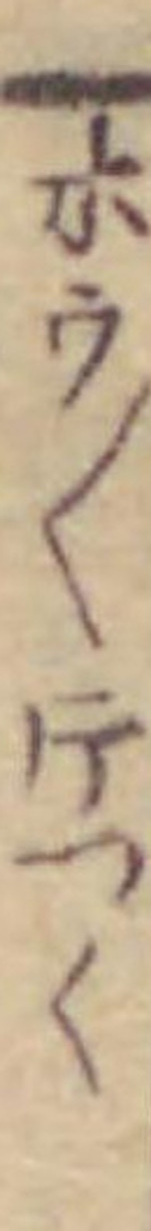ホウ〳〵片つく
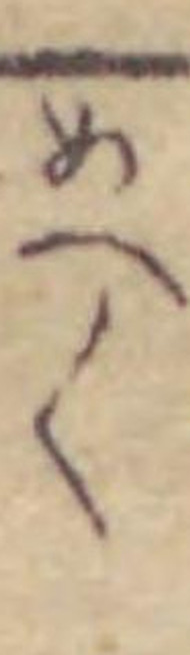めへ〳〵
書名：天下一面鏡梅鉢 : 3巻
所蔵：国立国会図書館 National Diet Library, JAPAN
